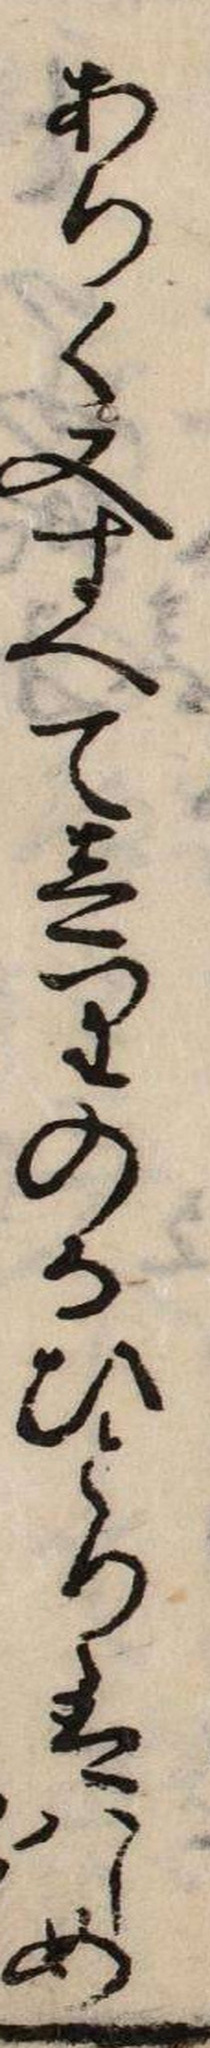ありく又すへて壱里のるひとりはしめ
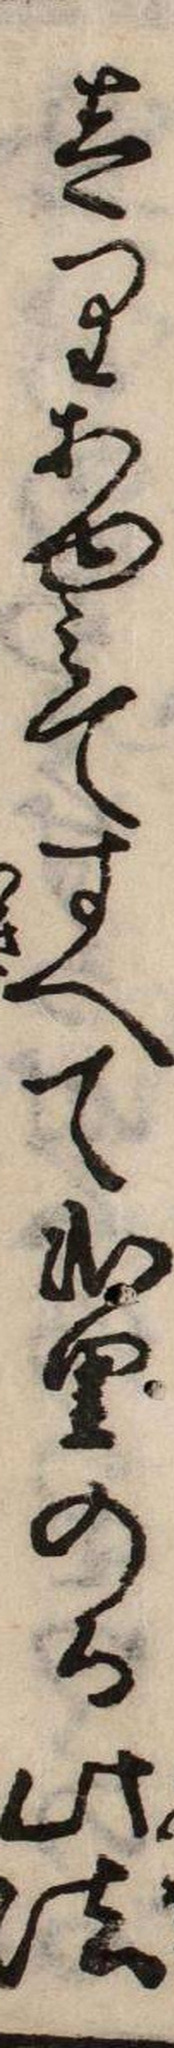壱里あゆみてすへて弐里のる此法
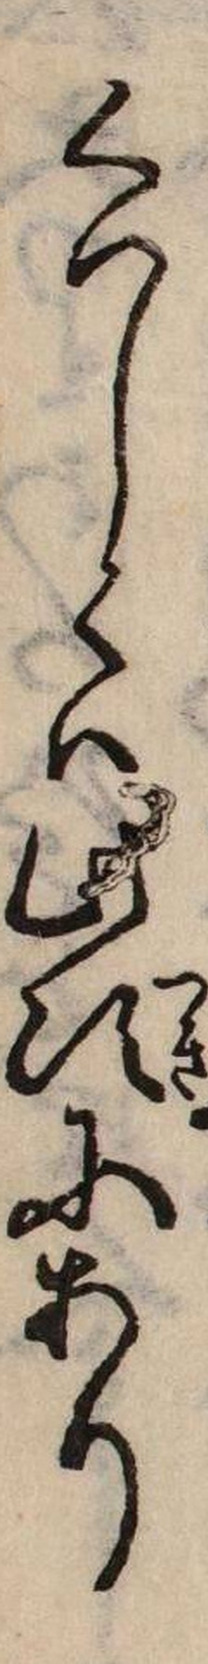くはしくは此次にあり

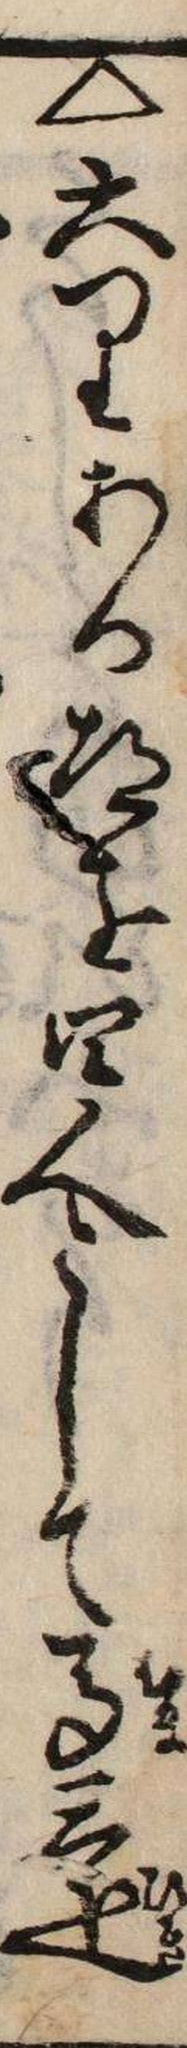△六里ある道を四人として馬三疋
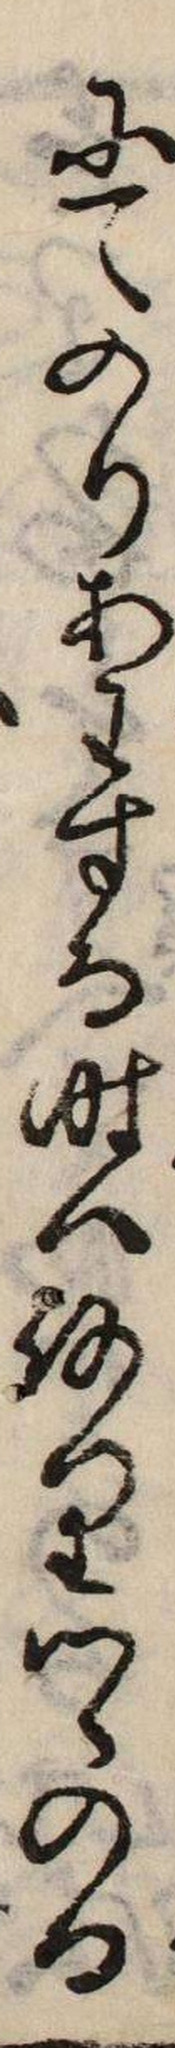にてのりあわする時は何里つつの日
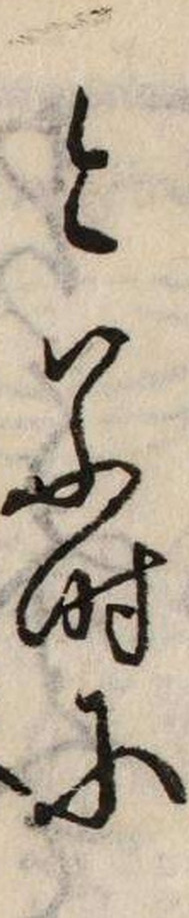といふ時に
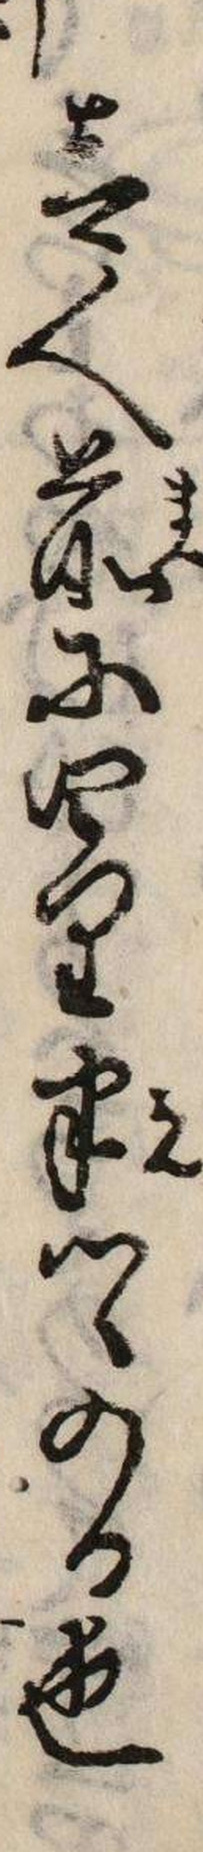壱人前に四里半つつのる也
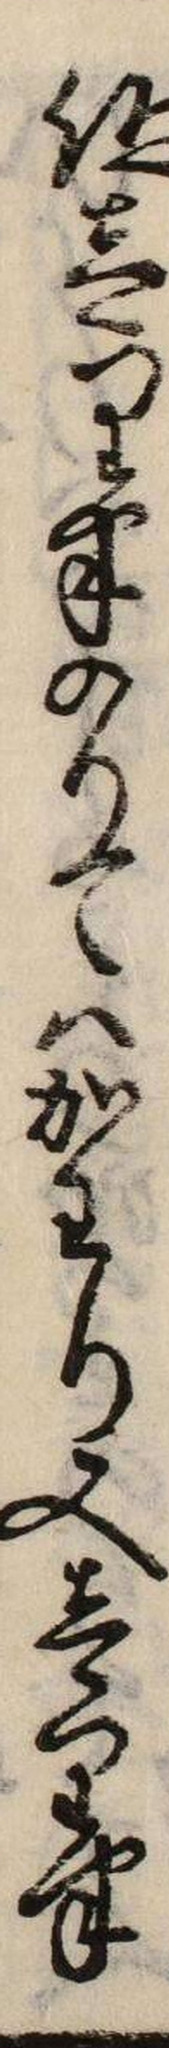但壱里半のりてはかわり又壱里半
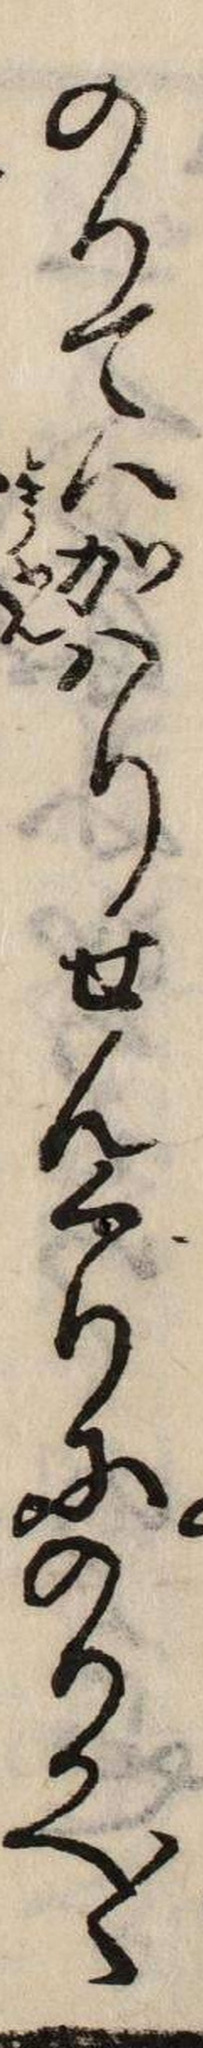のりてはかはりせんくりにのりかへかへ
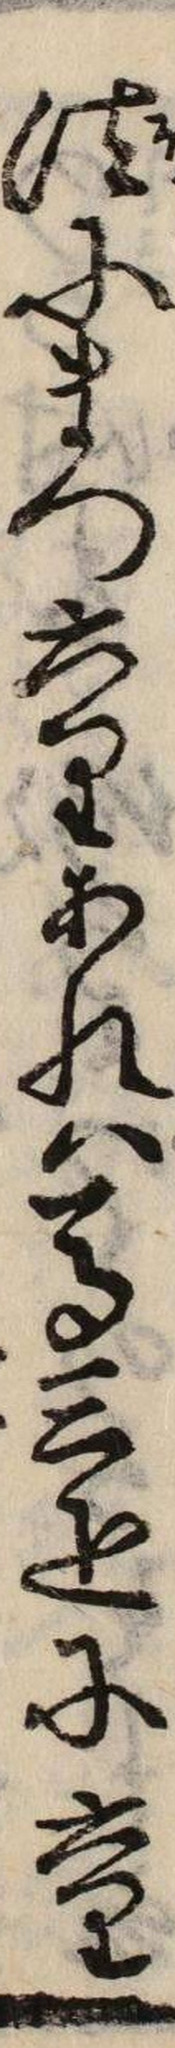法にまつ六里あれは馬三疋六里
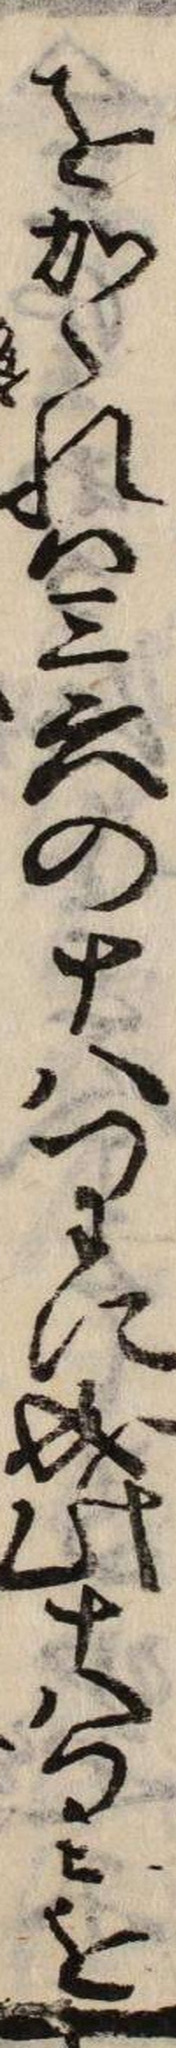をかくれは三六の十八里に成此十八里を
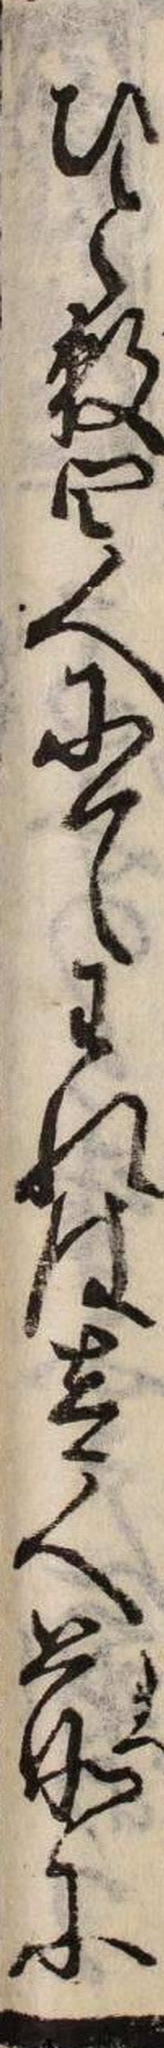ひと数四人にてわれは壱人前に
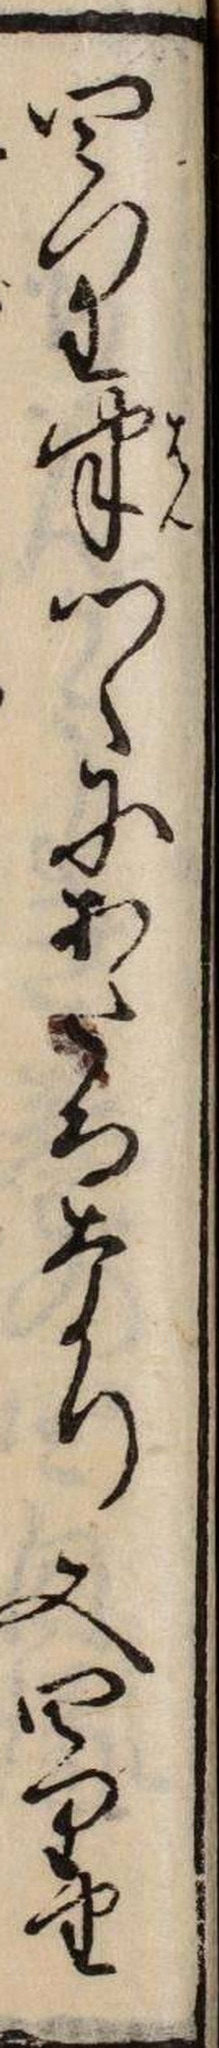四里半つつにあたるなり又四里半
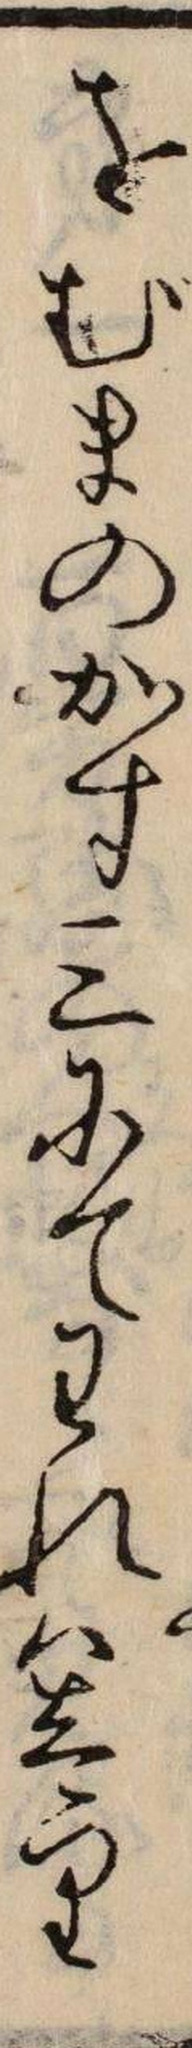をむまのかす三にてわれは壱里
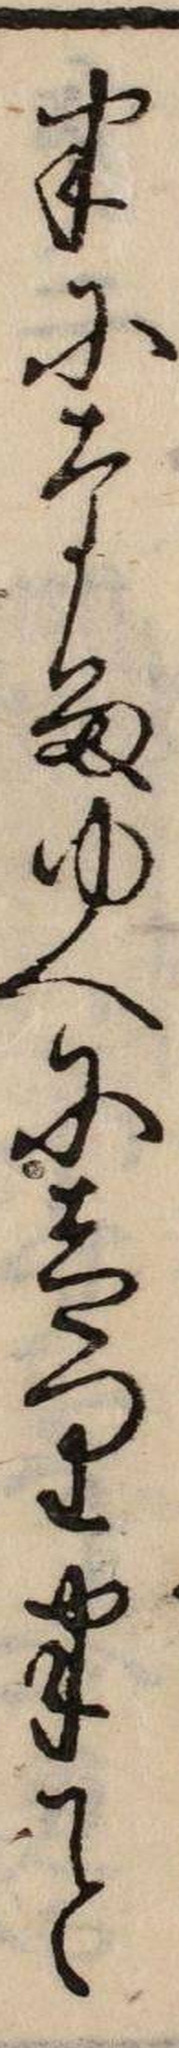半になるゆへに壱里半こと
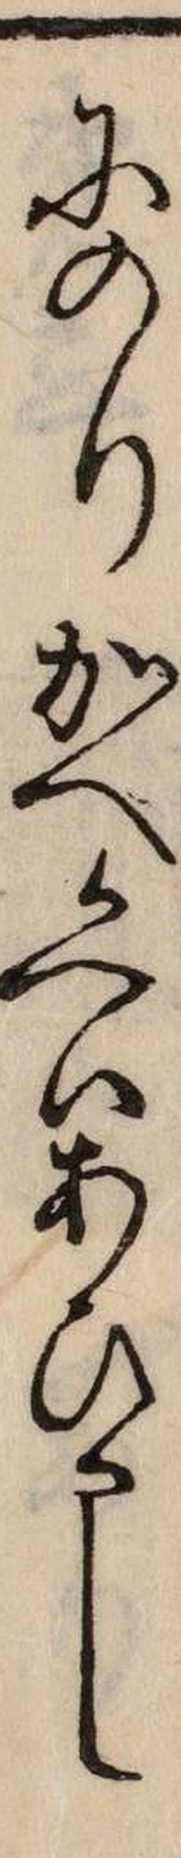にのりかへかへはあひ申候
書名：塵劫記（寛永11年自跋、京都府立京都学・歴彩館追貴8）
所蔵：京都府立京都学・歴彩館 国文学研究資料館
